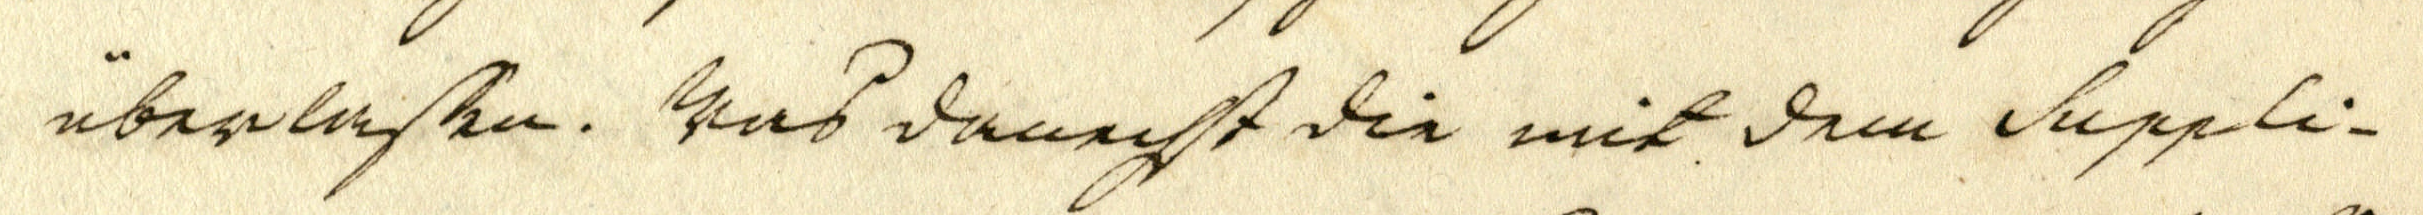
überlassen. Was danechst die mit dem Suppli¬
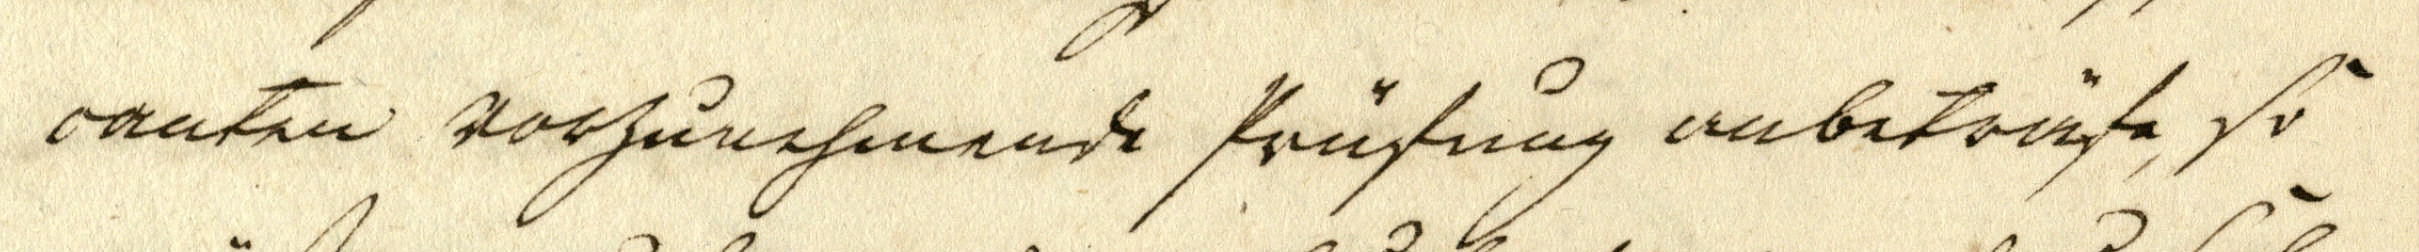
canten vorzunehmende Prüfung anbeträfe, so
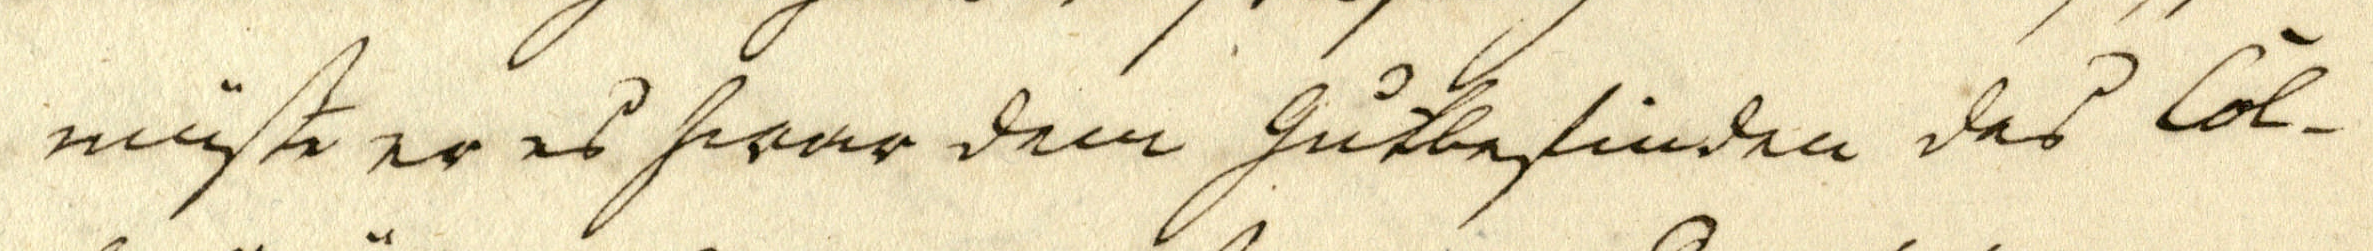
müste er es zwar dem Gutbefinden des Col¬
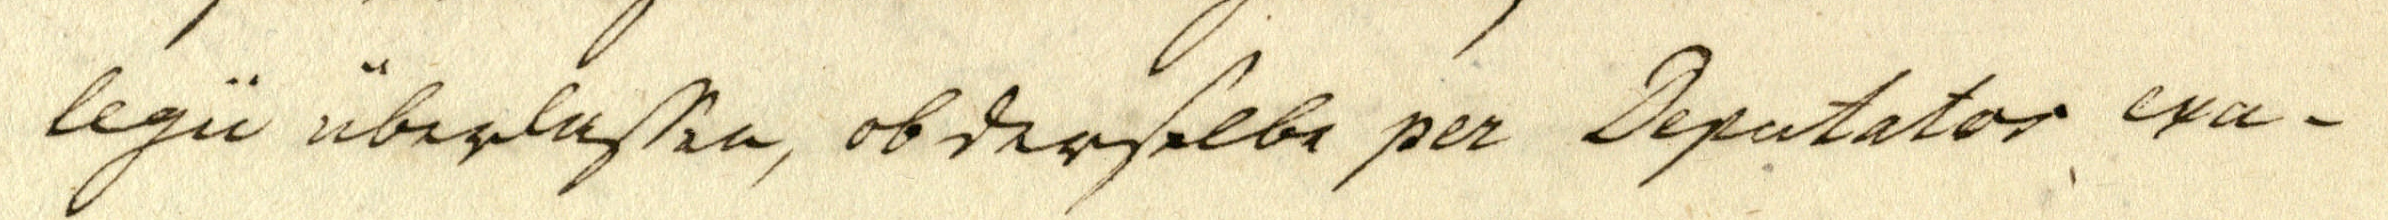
legii überlassen, ob derselbe per Deputatos exa¬
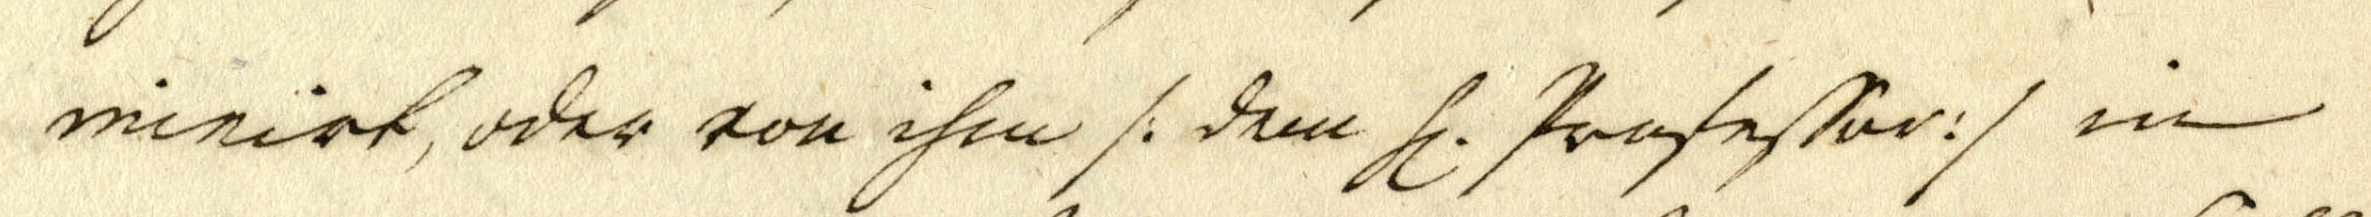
minirt, oder von ihm / dem h. Professor / in
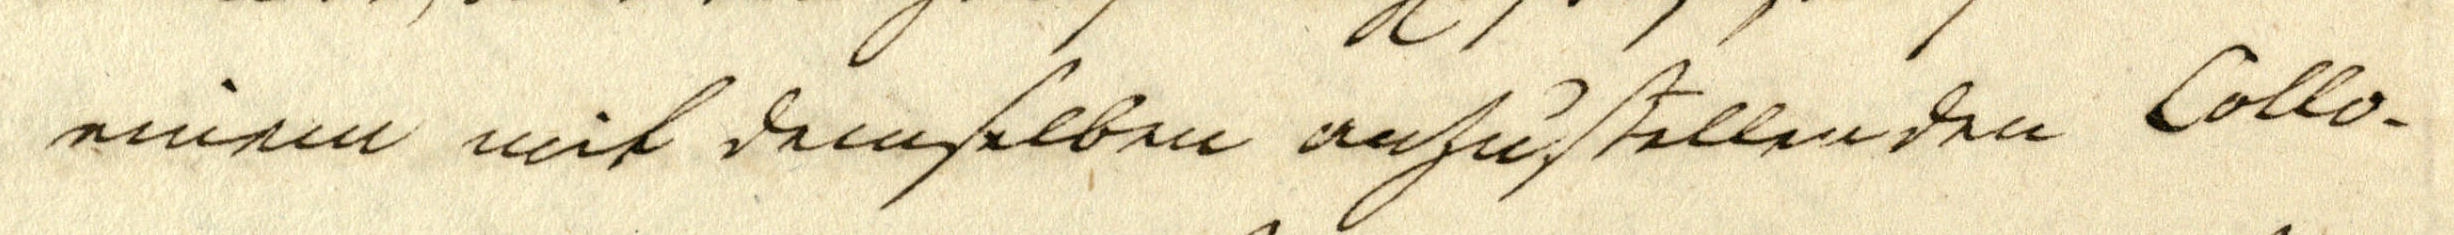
einem mit demselben anzustellenden Collo¬
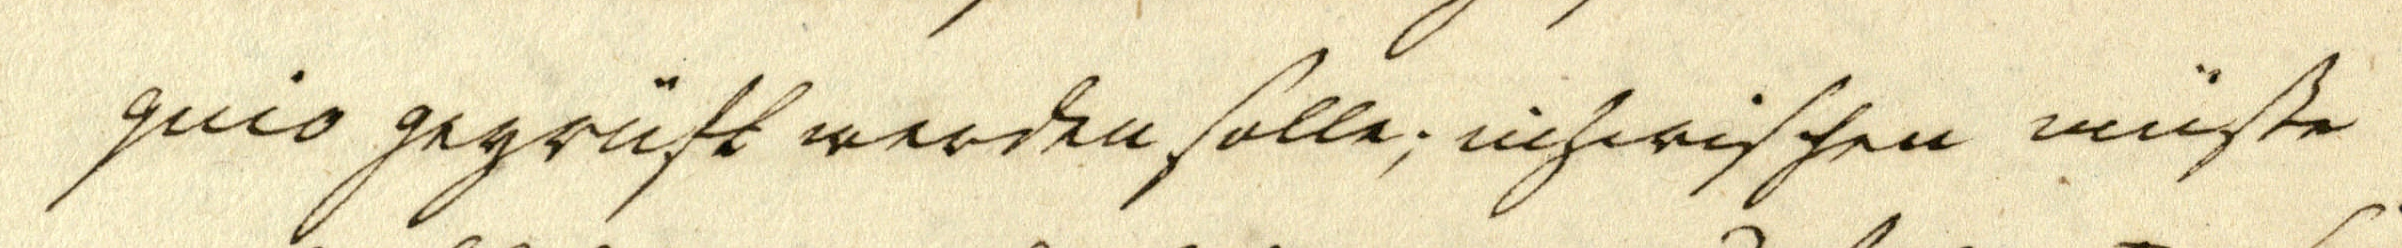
quio geprüft werden solle; inzwischen müsse
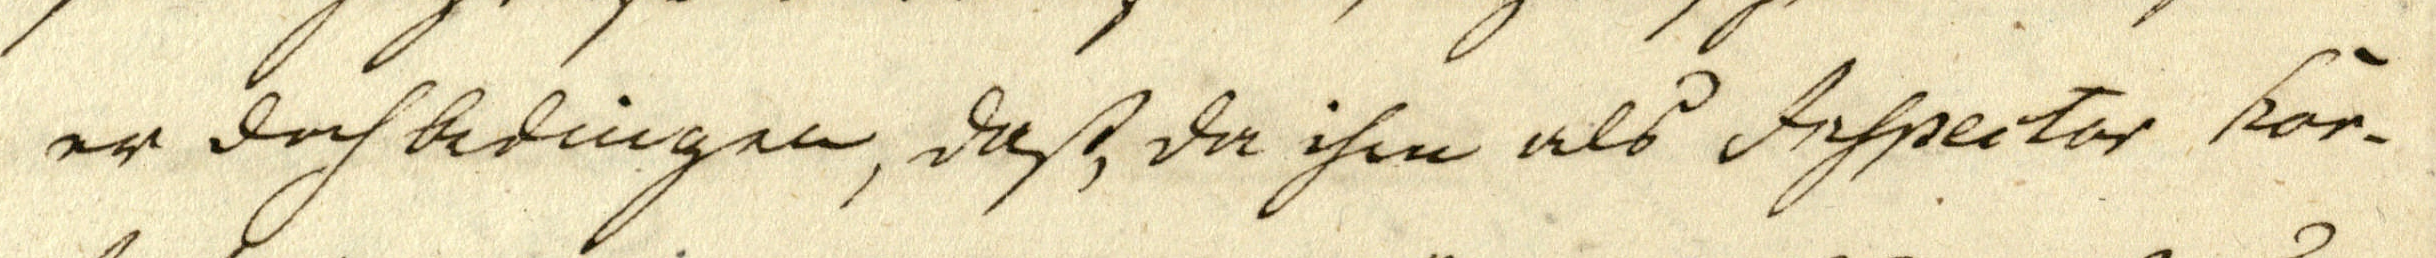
er doch bedingen, daß, da ihm als Inspector hor¬
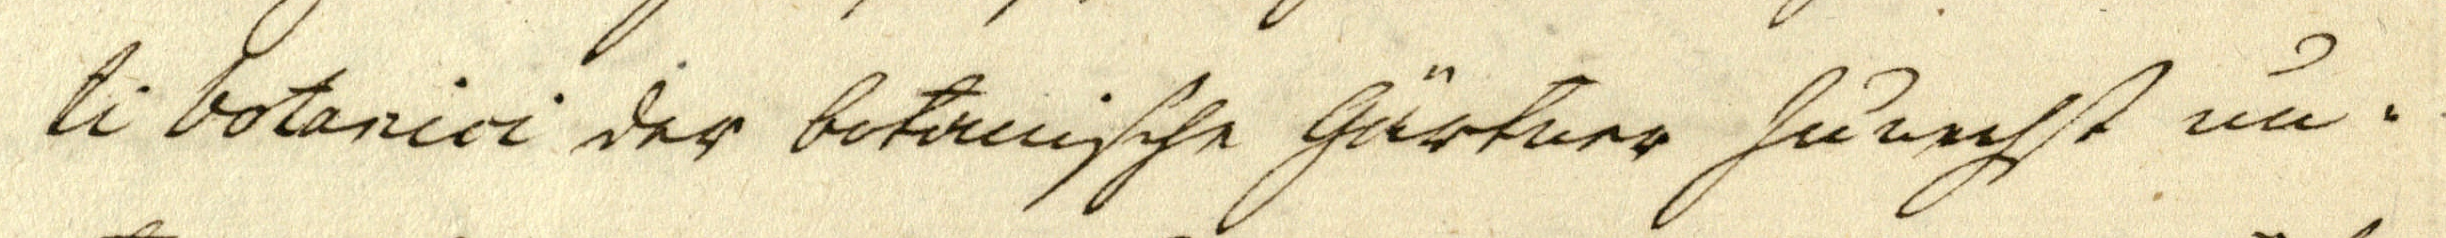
ti botanici der botanische Gärtner zunechst un¬
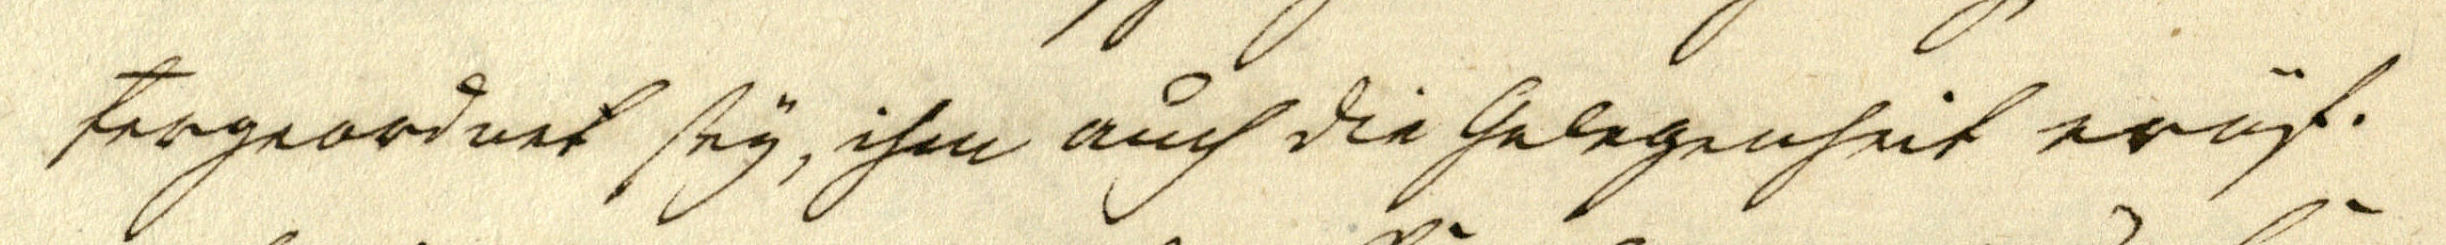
tergeordnet seÿ, ihm auch die Gelegenheit eröf¬
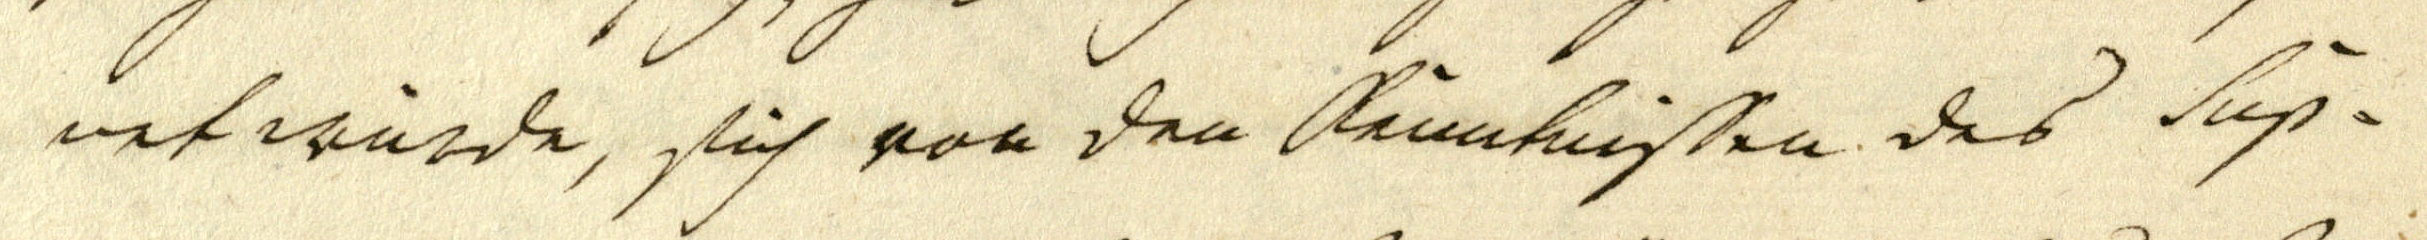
net würde, sich von den Kenntnissen des Sup¬
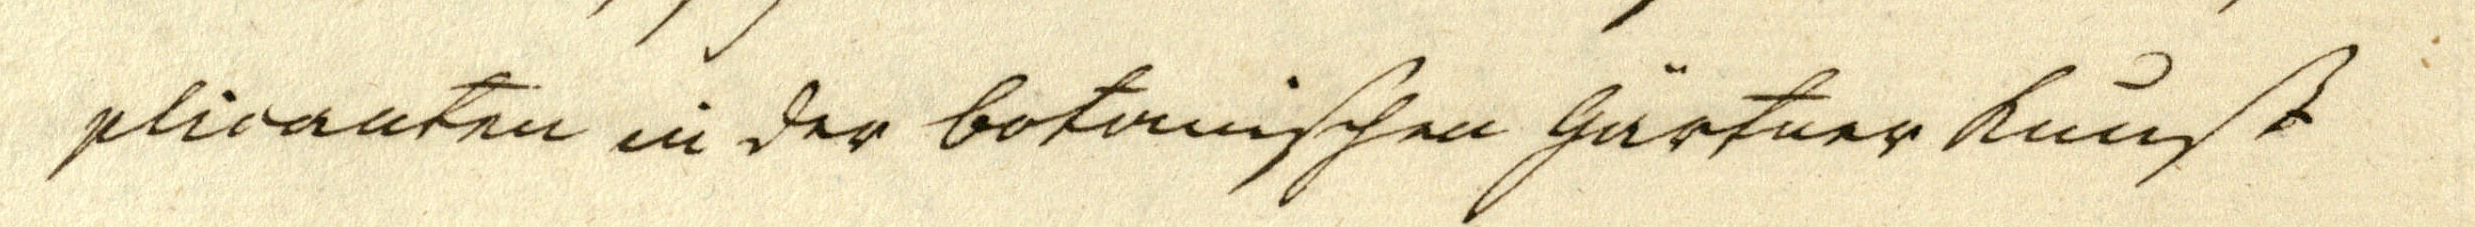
plicanten in der botanischen Gärtner Kunst
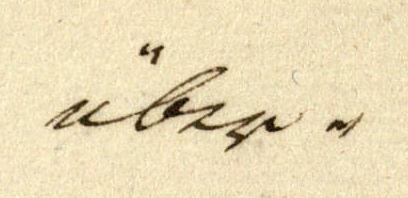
über
